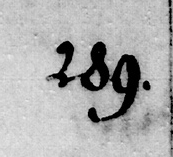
28.
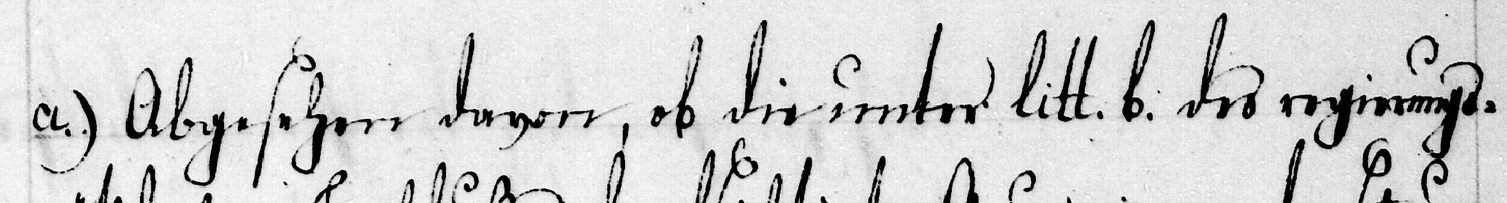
a.) Abgesehen davon, ob die unter litt. b. des regie¬
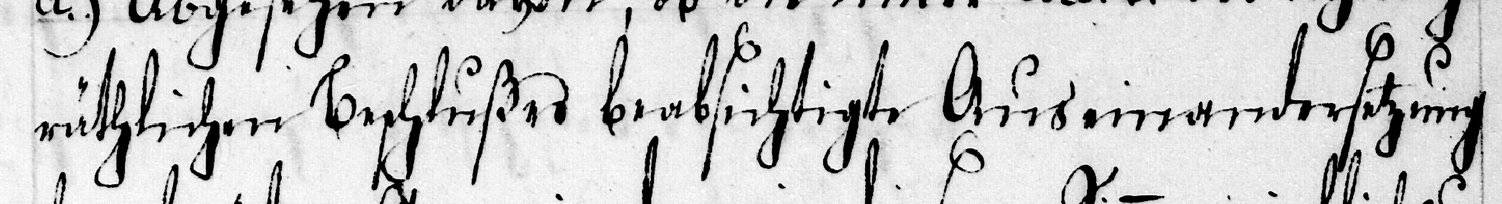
räthlichen Beschlußes beabsichtigte Auseinandersetzung
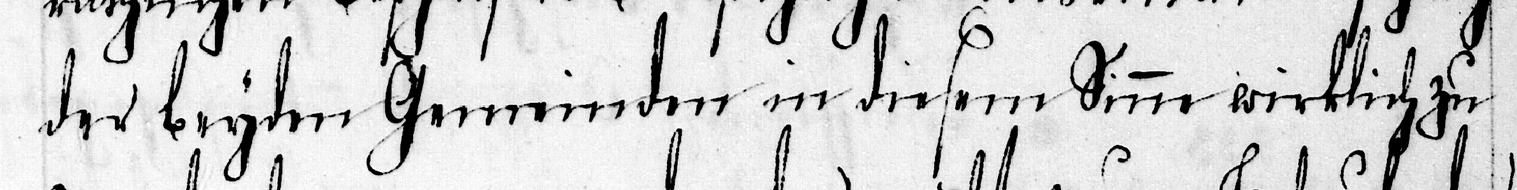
der beyden Gemeinden in diesem Sinne wirklich zu
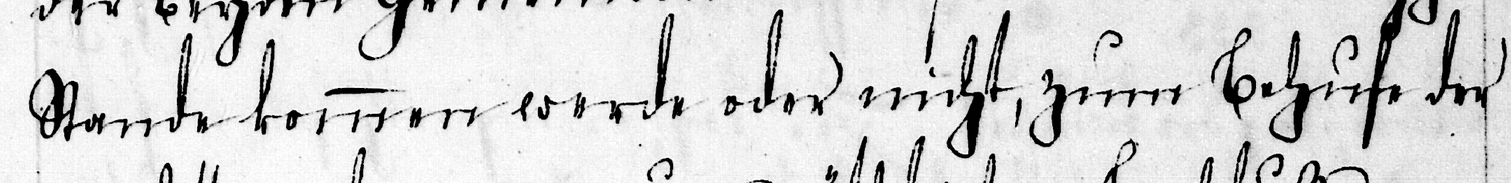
Stande kommen werde oder nicht, zum Behufe der
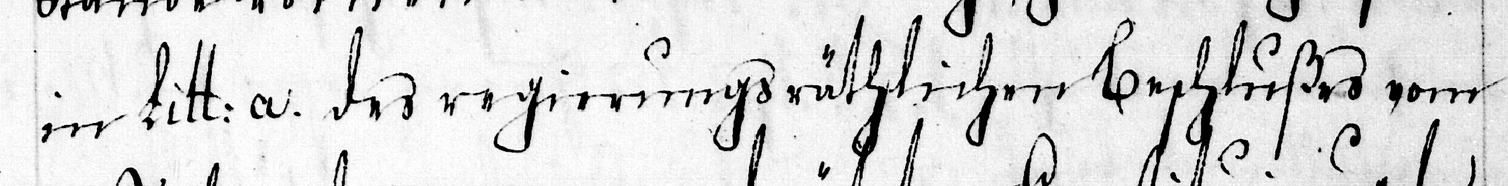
in Litt: a. des regierungsräthlichen Beschlußes vom
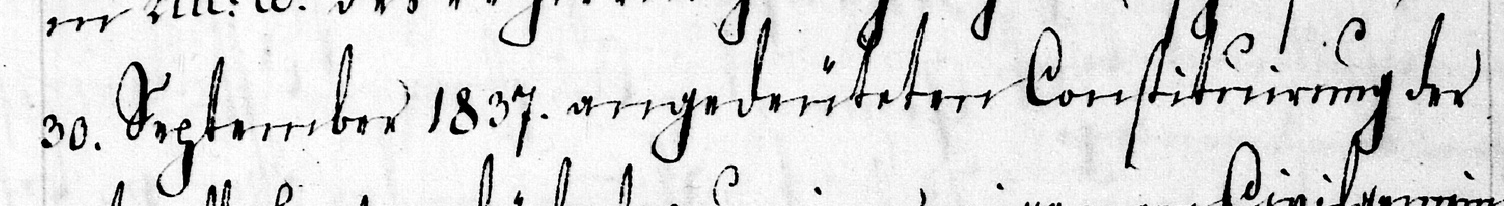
30. September 1837. angedeuteten Constituirung der
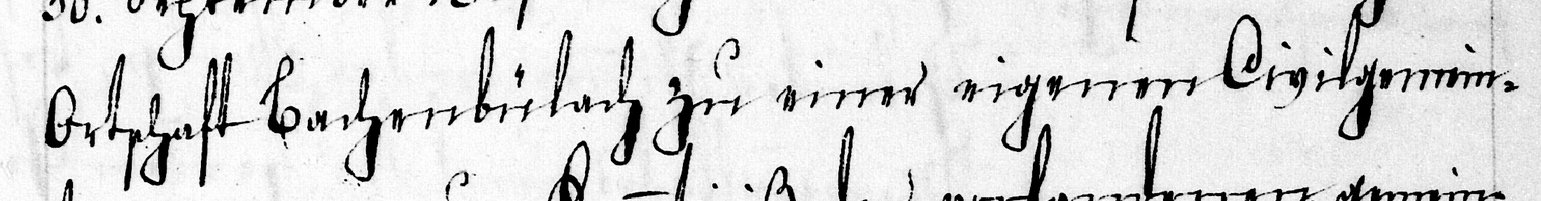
Ortschaft Bachenbülach zu einer eigenen Civilgemein¬
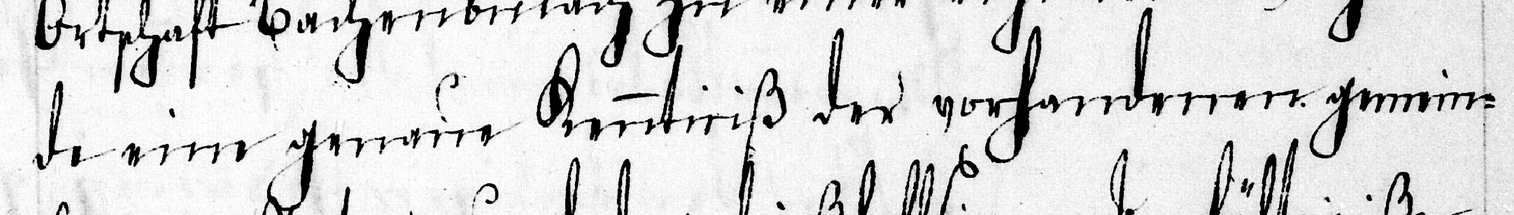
de eine genaue Kenntniß der vorhandenen gemein¬
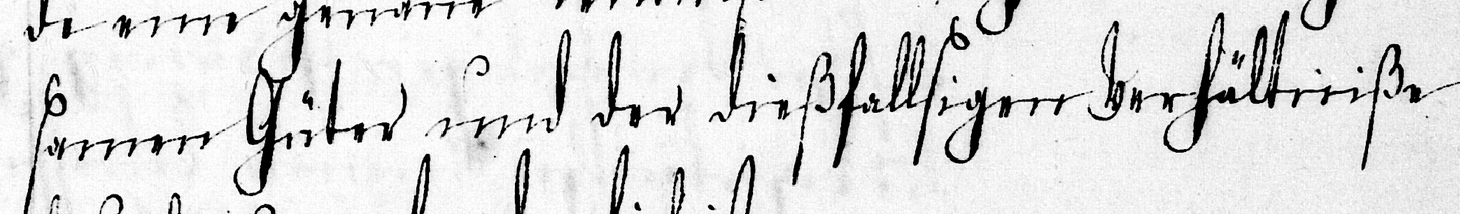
samen Güter und der dießfallsigen Verhältniße
